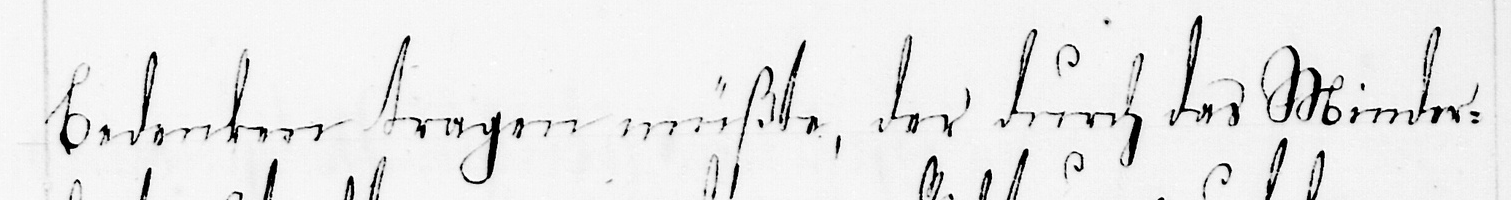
Bedenken tragen müßte, der durch das Minder¬
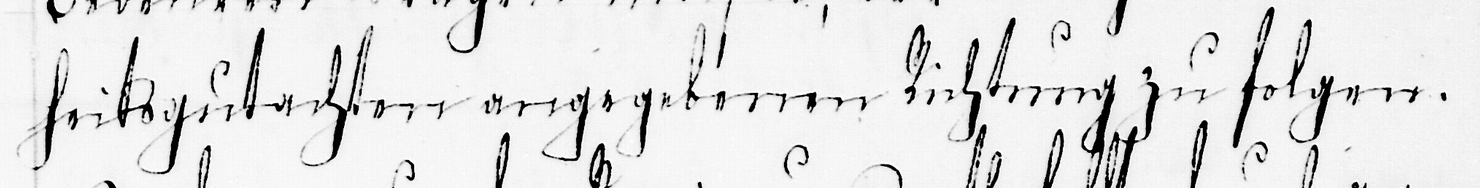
heitsgutachten angegebenen Richtung zu folgen.
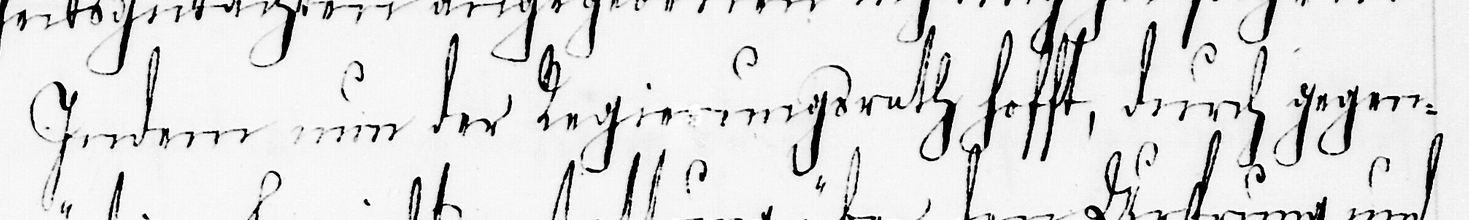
Indem nun der Regierungsrath hofft, durch gegen¬
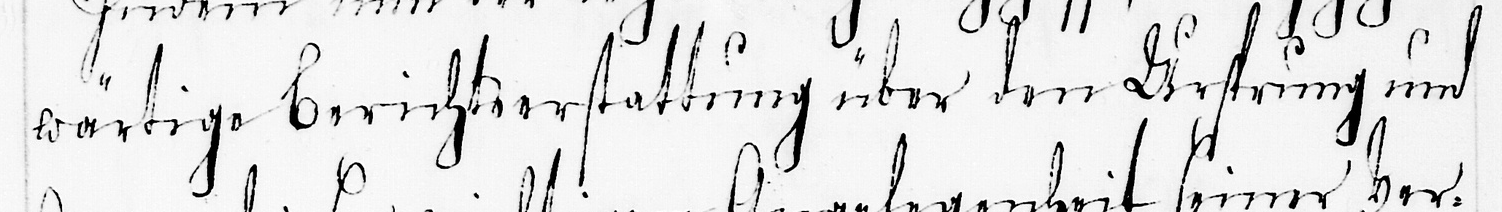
wärtige Berichtserstattung über den Ursprung und
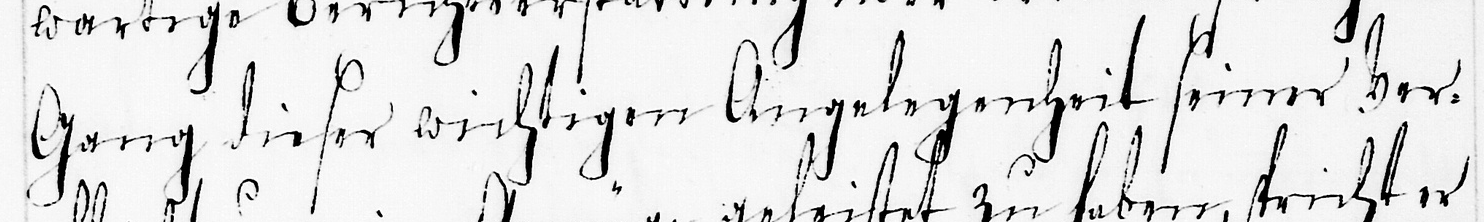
Gang dieser wichtigen Angelegenheit seiner Ver¬
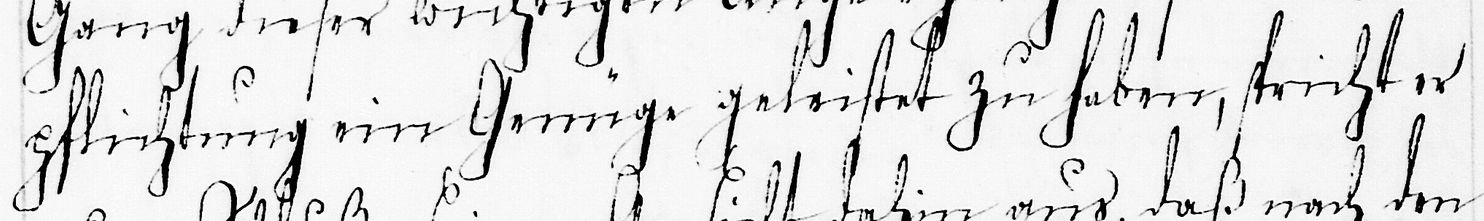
pflichtung ein Genüge geleistet zu haben, spricht er
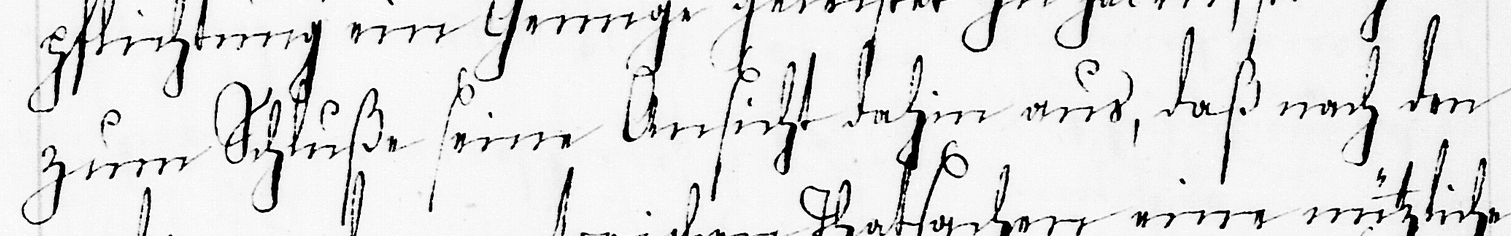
zum Schluße seine Ansicht dahin aus, daß nach den
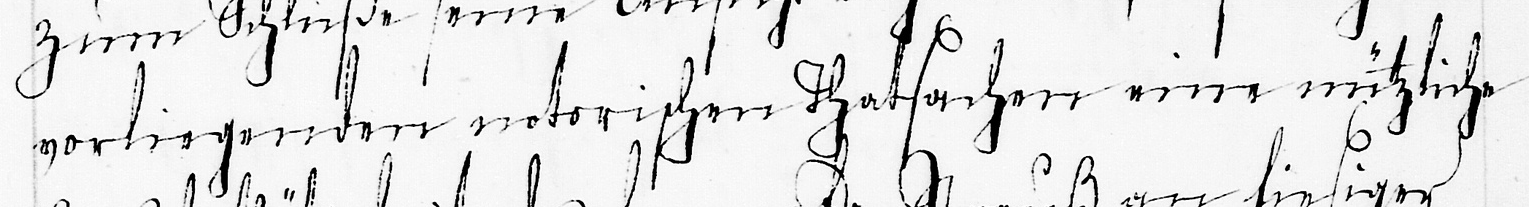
vorliegenden notorischen Thatsachen eine nützliche
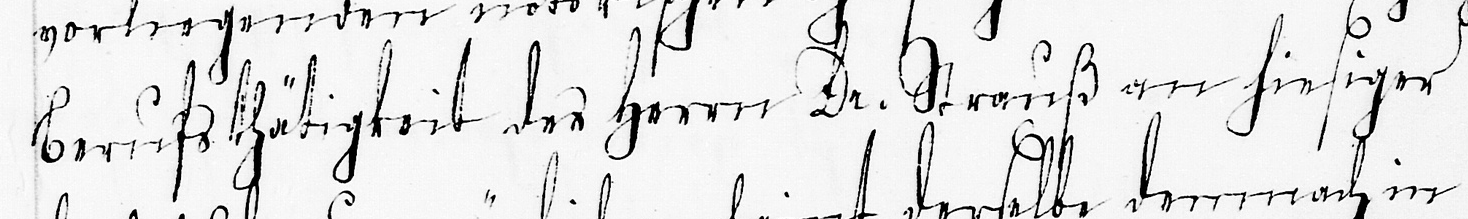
Berufsthätigkeit des Herrn Dr. Strauß an hiesiger
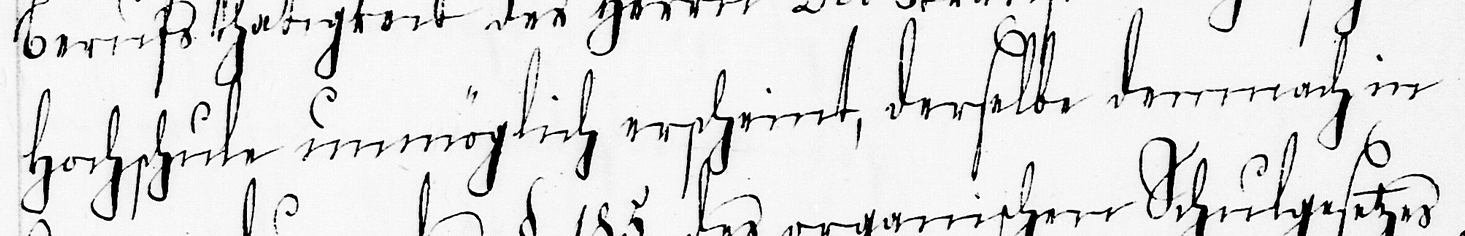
Hochschule unmöglich erscheint, derselbe demnach in
